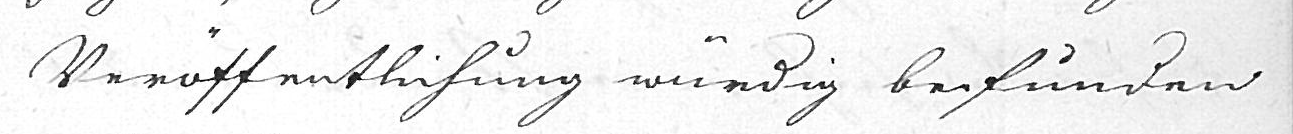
Veröffentlichung würdig befunden
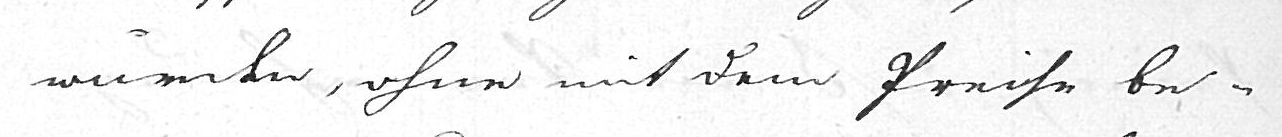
wurden, ohne mit dem preise be-
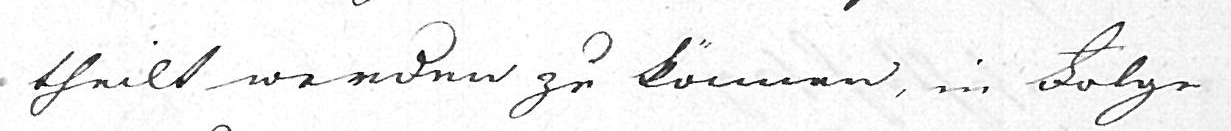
theilt werden zu können, in Folge
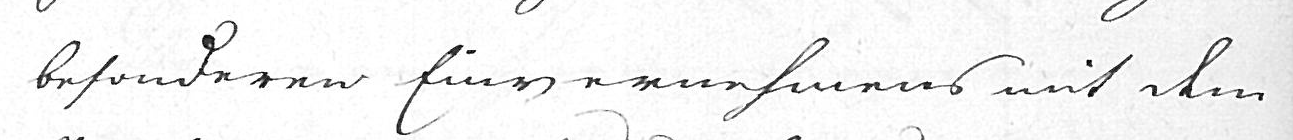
besonderen Einvernehmens mit dem
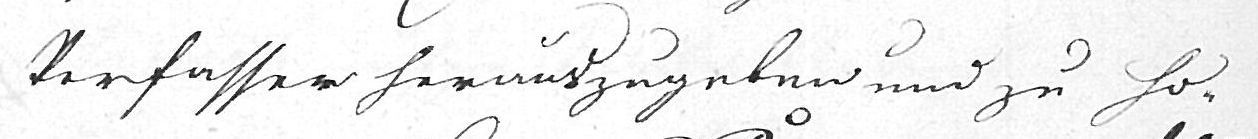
Verfasser herauszugeben und zu ho-
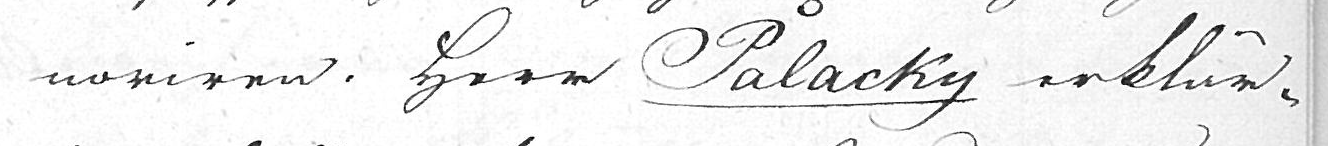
noriren. Herr Palacky erklär-
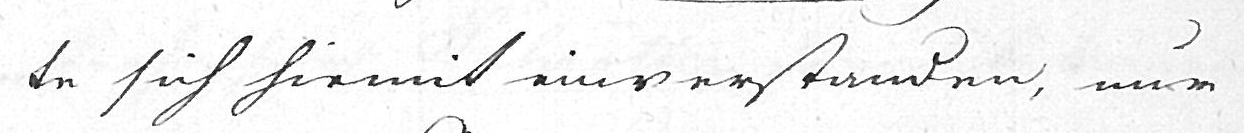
te sich hiemit einverstanden, nur
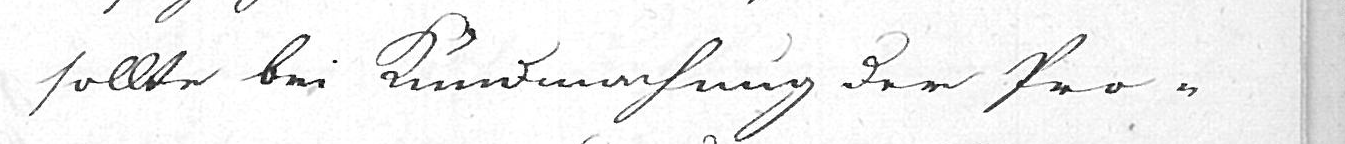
sollte bei Kundmachung der Pro
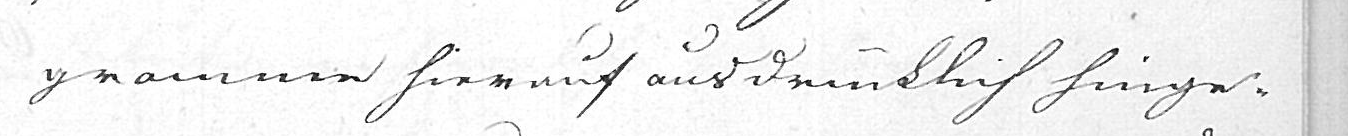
gramme hierauf ausdrücklich hinge-
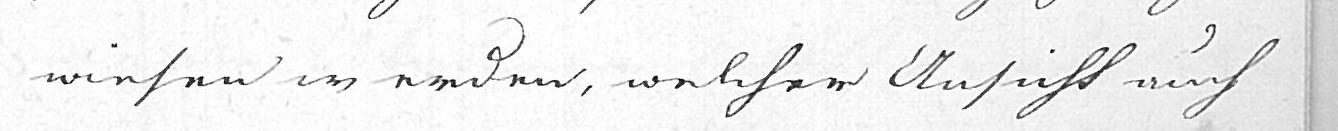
wiesen werden, welcher Ansicht auch
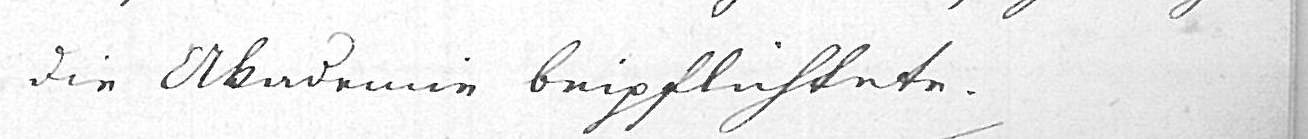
die Akademie beipflichtete.
